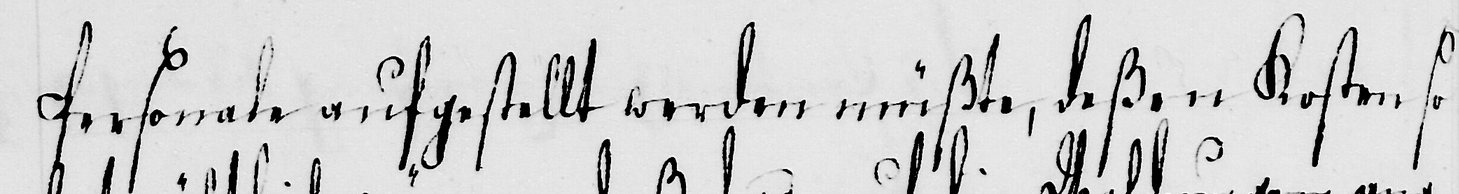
Personale aufgestellt werden müßte, deßen Kosten
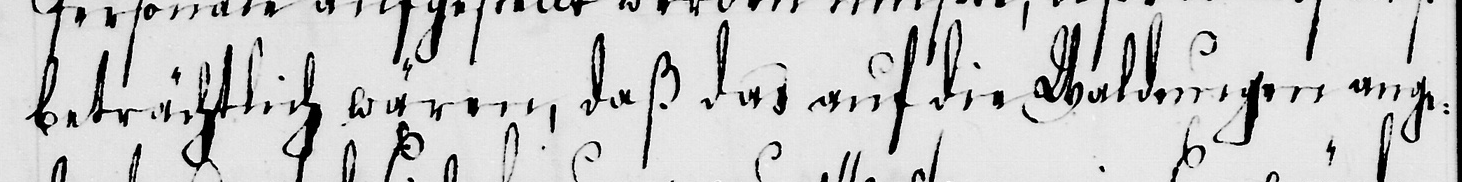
beträchtlich wären, daß das auf die Waldungen ange¬
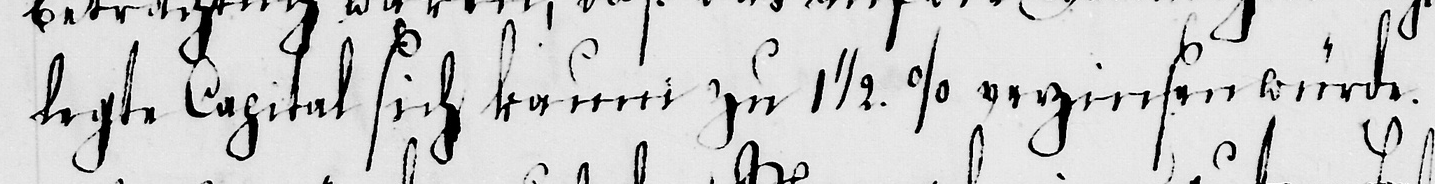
legte Capital sich kaum zu 11/2. % verzinsen würde.
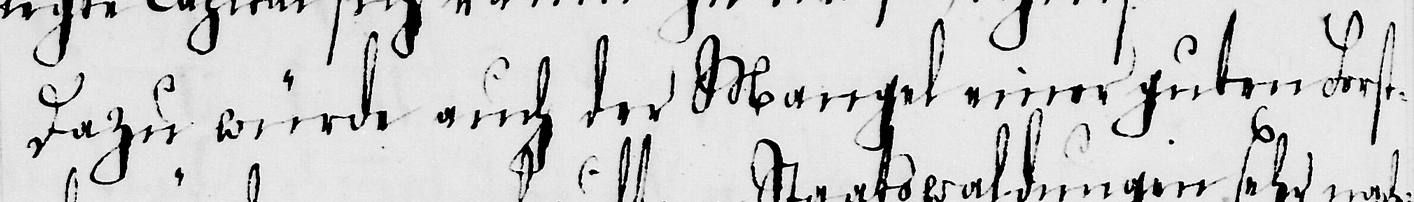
Dazu würde auch der Mangel einer guten Fors¬
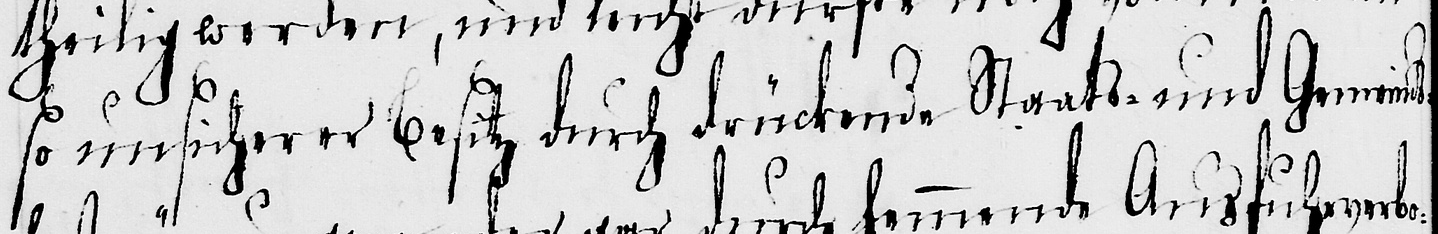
so unsicherer Besitz durch drückende Staats- und Gemei¬
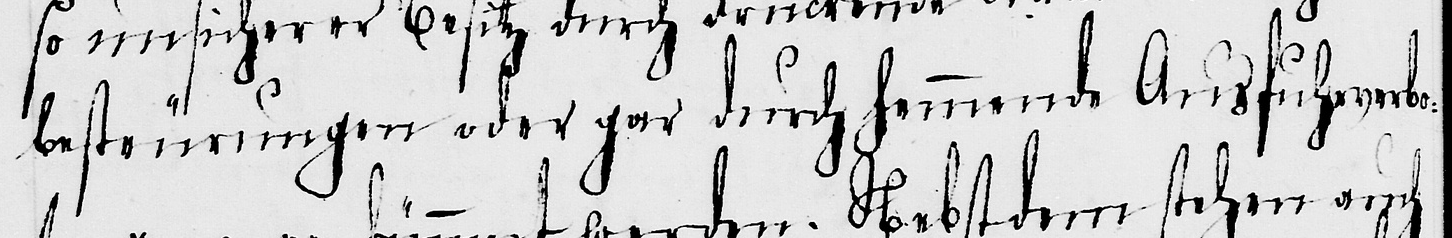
besteuerungen oder gar durch hemmende Ausfuhrverb¬
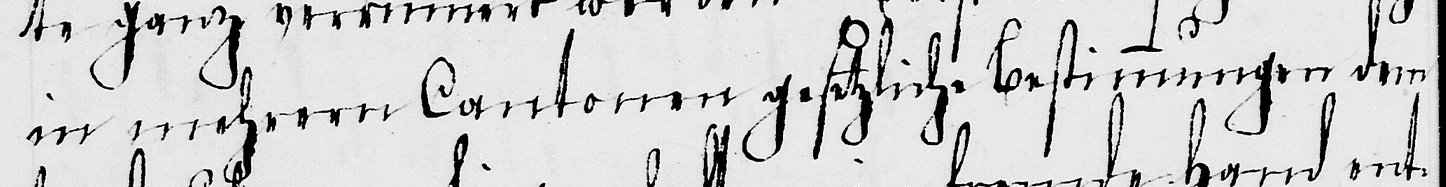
in mehrern Cantonen gesetzliche Bestimmungen dem
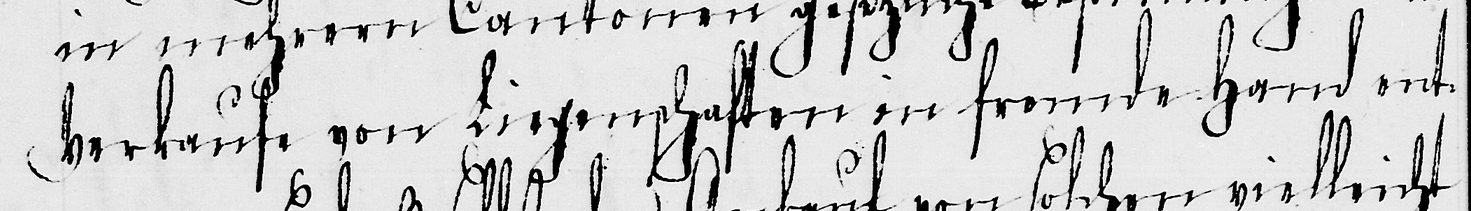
Verkaufe von Liegenschaften in fremde Hand ent¬
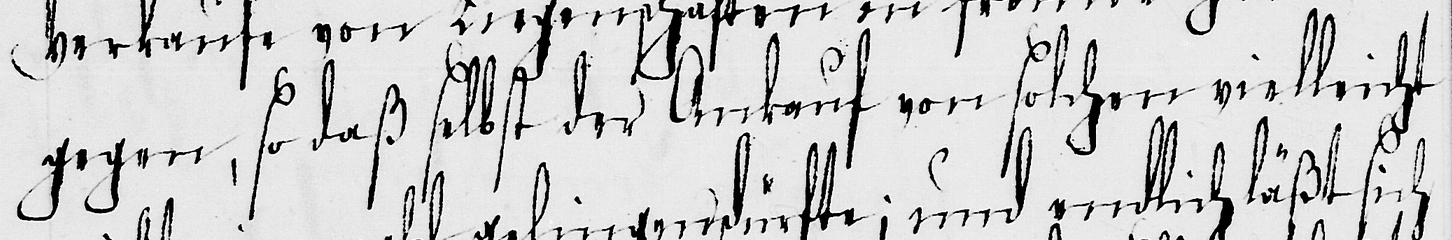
gegen, so daß selbst der Ankauf von solchen vielleic¬
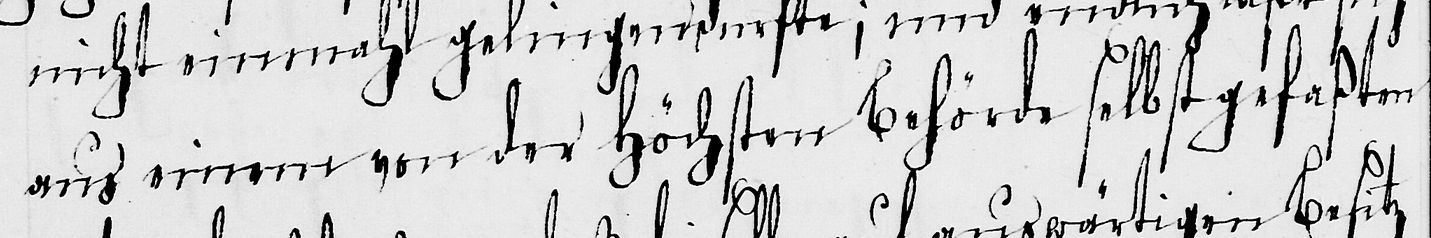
aus einem von der Höchsten Behörde selbst gefaßten
